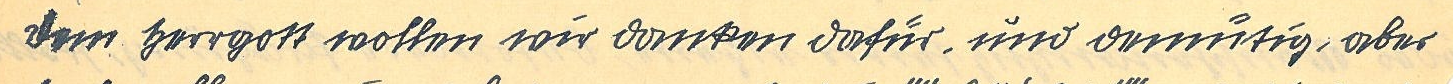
Dem Herrgott wollen wir danken dafür, und demütig, aber
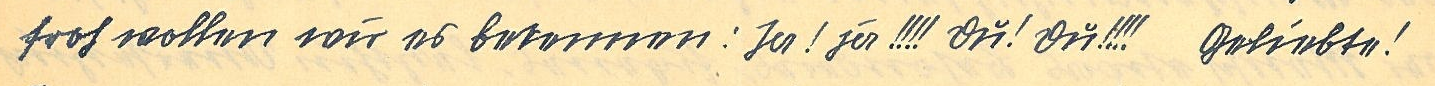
froh wollen wir es bekennen: Ja! ja!!!! Du! Du!!!! Geliebte!
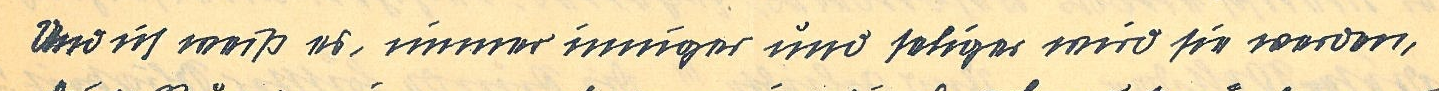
Und ich weiß es, immer inniger und seliger wird sie werden,
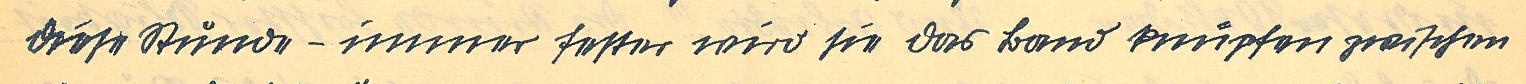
diese Stunde – immer fester wird sie das Band knüpfen zwischen
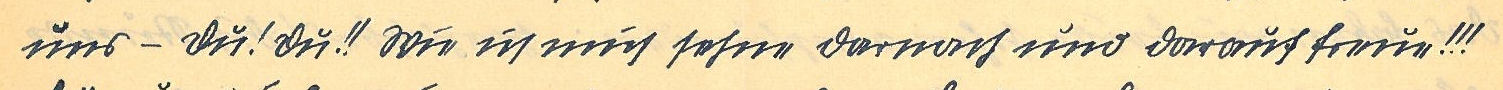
uns – Du! Du!! Wie ich mich sehne darnach und darauf freue!!!
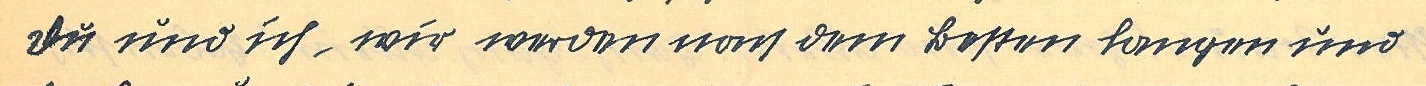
Du und ich, wir werden nach dem Besten langen und
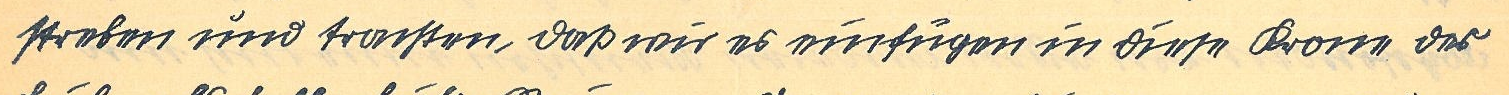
streben und trachten daß wir es einfügen in diese Krone der
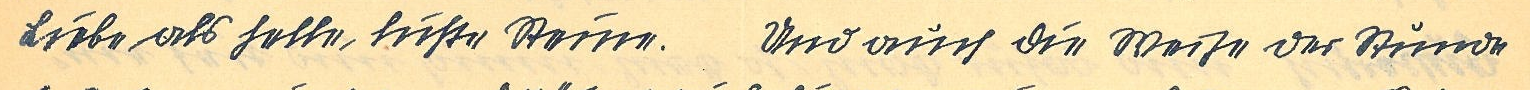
Liebe als helle, lichte Steine. Und auch die Weihe der Stunde
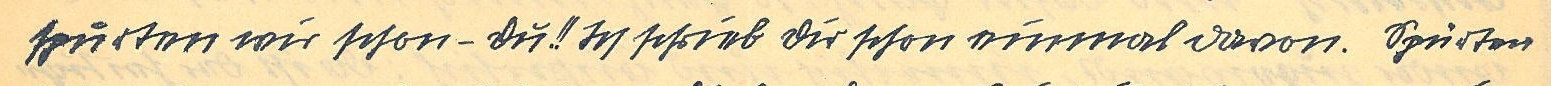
spürten wir schon – Du!! Ich schrieb Dir schon einmal davon. Spürten
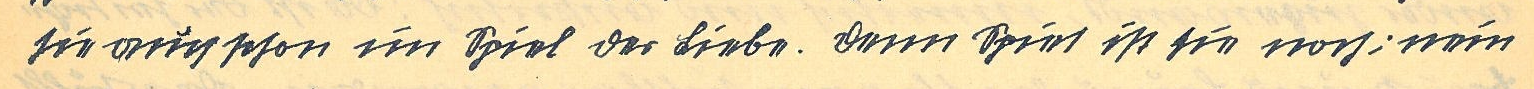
sie auch schon im Spiel der Liebe. Denn Spiel ist sie noch; nein,
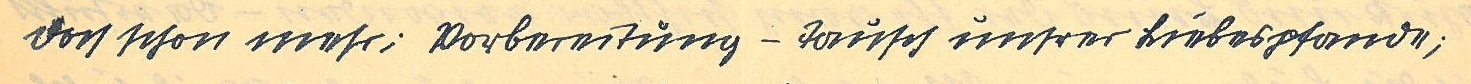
doch schon mehr; Vorbereitung – Tausch unserer Liebespfande;
